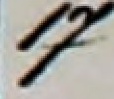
17
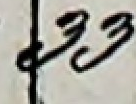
33
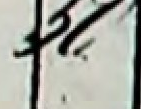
50
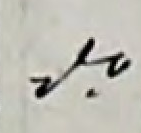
Do
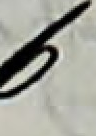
6
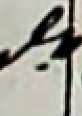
Do
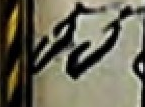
55
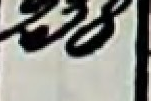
238
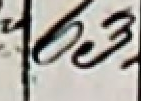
63
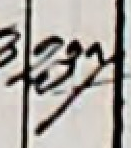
237
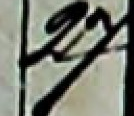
27
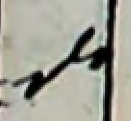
Do
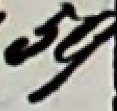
59
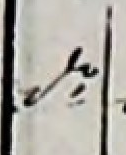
Do
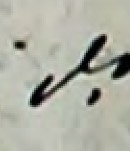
Do
